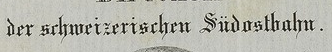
der schweizerischen Südostbahn.
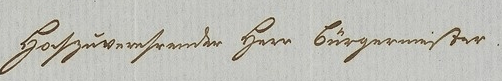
Hochzuverehrender Herr Bürgermeister!
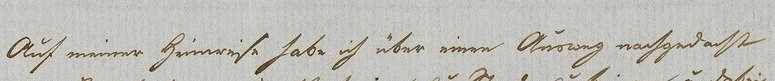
Auf meiner Heimreise habe ich über einen Ausweg nachgedacht
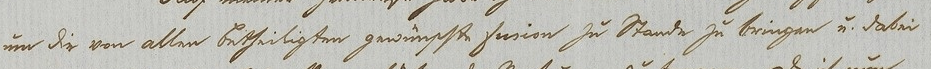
um die von allen Betheiligten gewünschte Fusion zu Stande zu bringen u. dabei
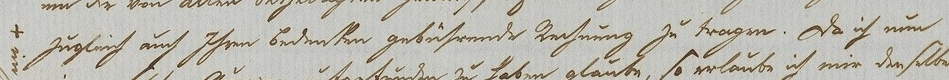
zugleich auch Ihren Bedenken gebührende Rechnung zu tragen. Da ich nun
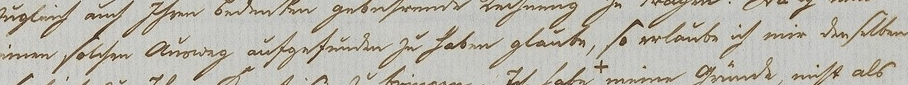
einen solchen Ausweg aufgefunden zu haben glaube, so erlaube ich mir denselben
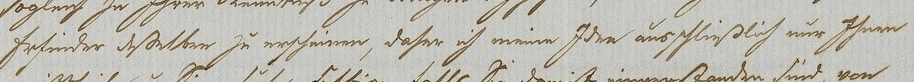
Erfinder deßelben zu erscheinen, daher ich meine Idee ausschließlich nur Ihnen
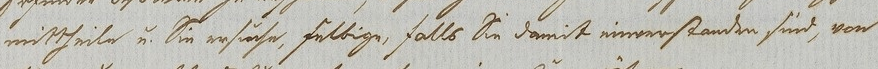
mittheile u. Sie ersuche, selbige, falls Sie damit einverstanden sind, von
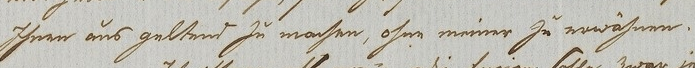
Ihnen aus geltend zu machen, ohne meiner zu erwähnen.
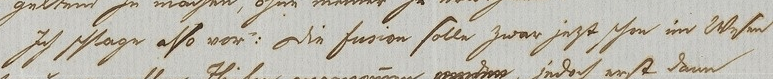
Ich schlage also vor: Die Fusion solle zwar jezt schon im Wesen
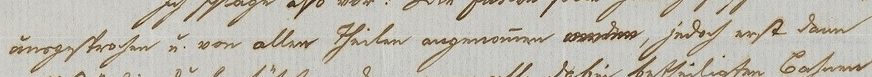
ausgesprochen u. von allen Theilen angenommen werden, jedoch erst dann
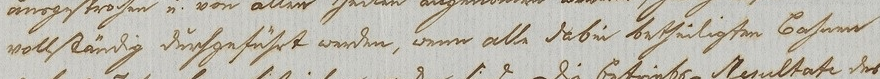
vollständig durchgeführt werden, wenn alle dabei betheiligten Bahnen
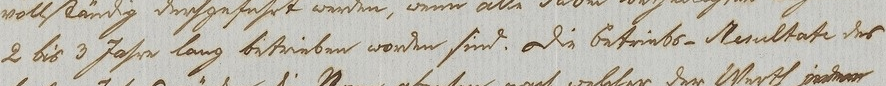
2 bis 3 Jahre lang betrieben worden sind. Die Betriebs-Resultate des
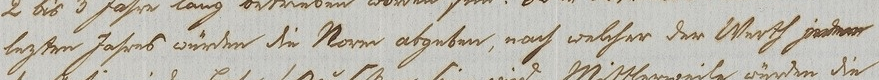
lezten Jahres würden die Norm abgeben, nach welcher der Werth jeder
